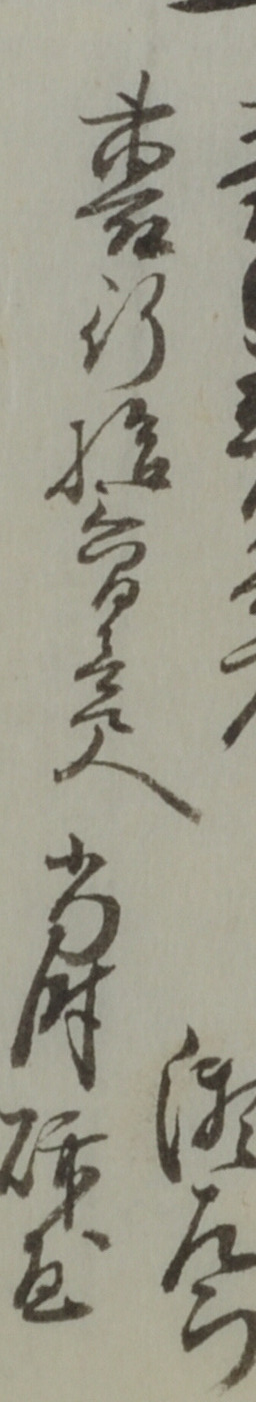裏行拾三間壱尺当時研屋
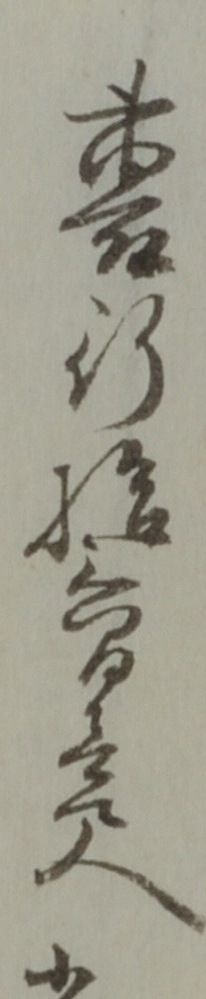裏行拾間壱尺当時
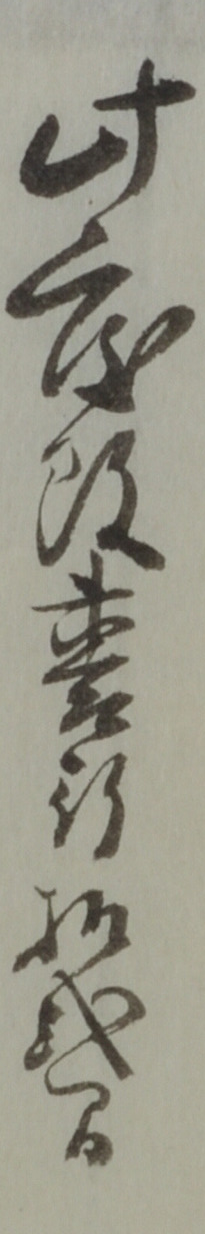此度改裏行拾弐間
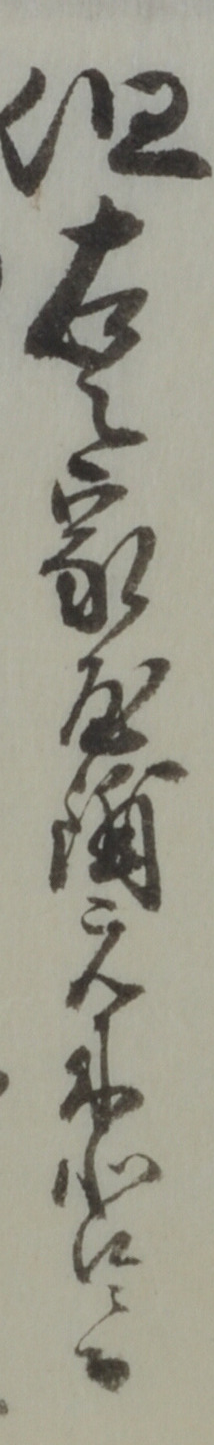但右之家屋鋪元来北口ニ而
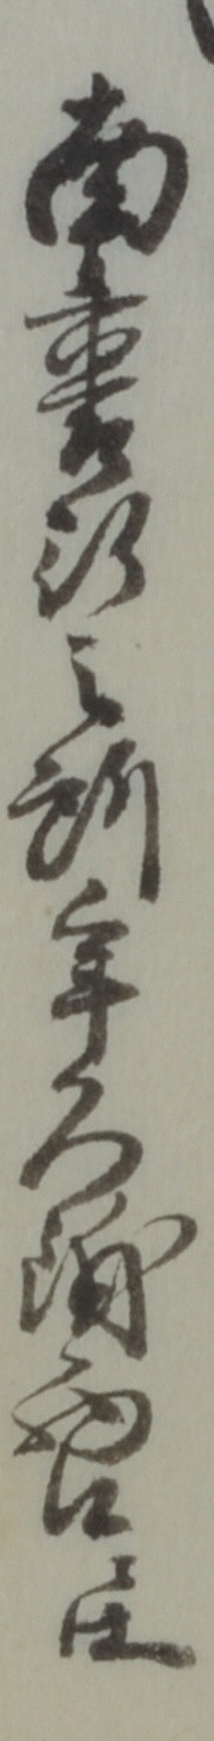南裏行之所年久鋪西口ニ仕
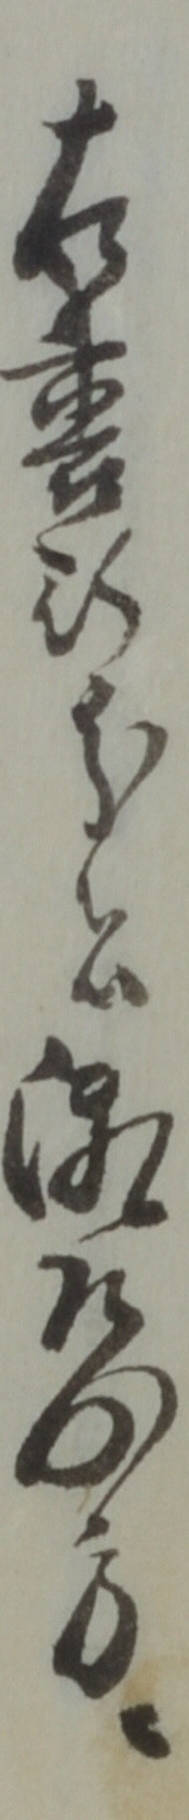右裏行分は瀬左衛門方ニ
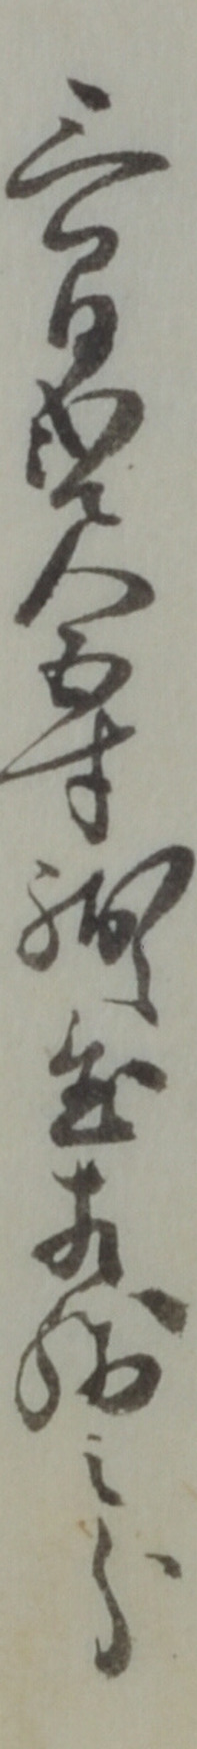三間弐尺五寸残し置相残之分
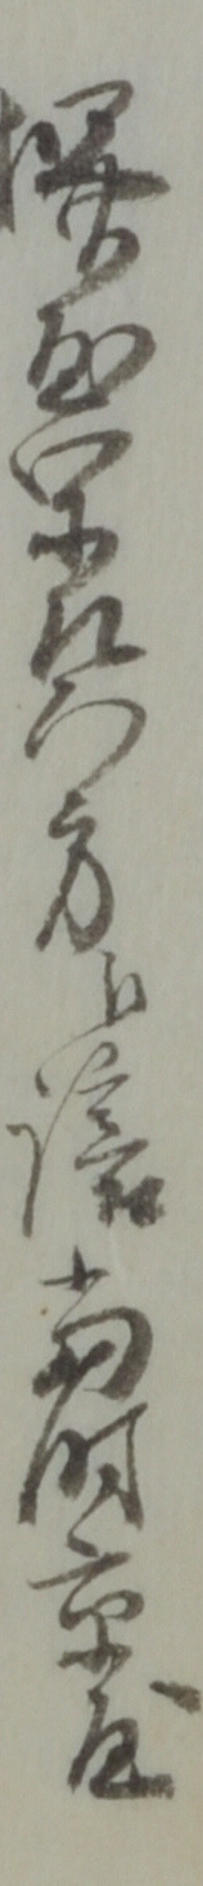堺屋閑左衛門方江譲当時京屋
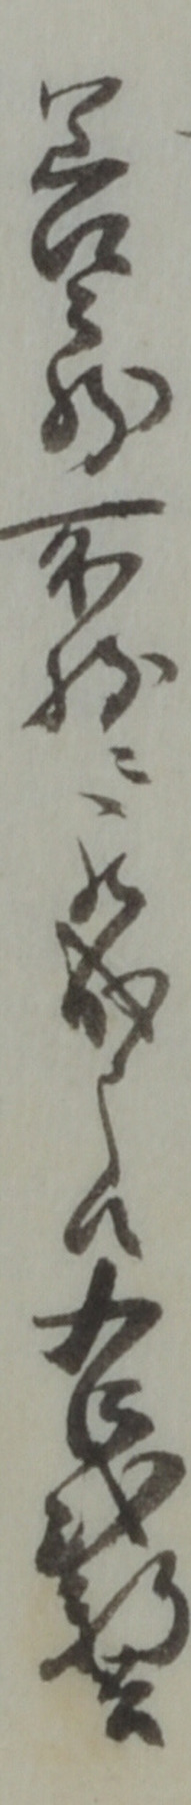善蔵所持ニ罷成申候右弐軒共
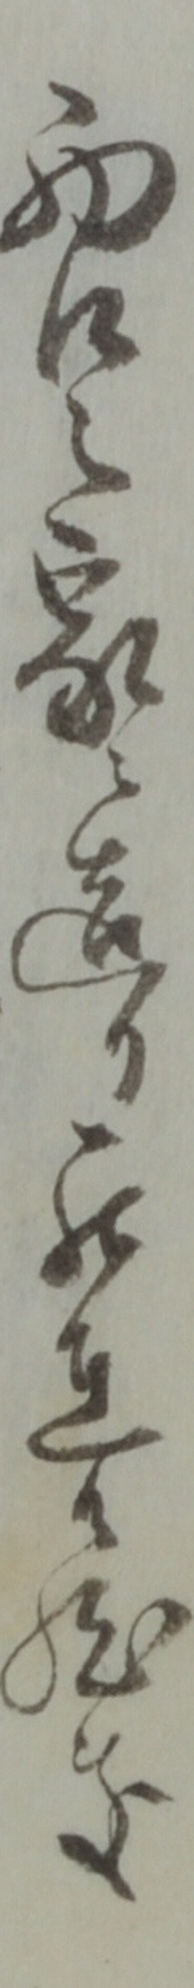西口之家ニ造り罷在候然処
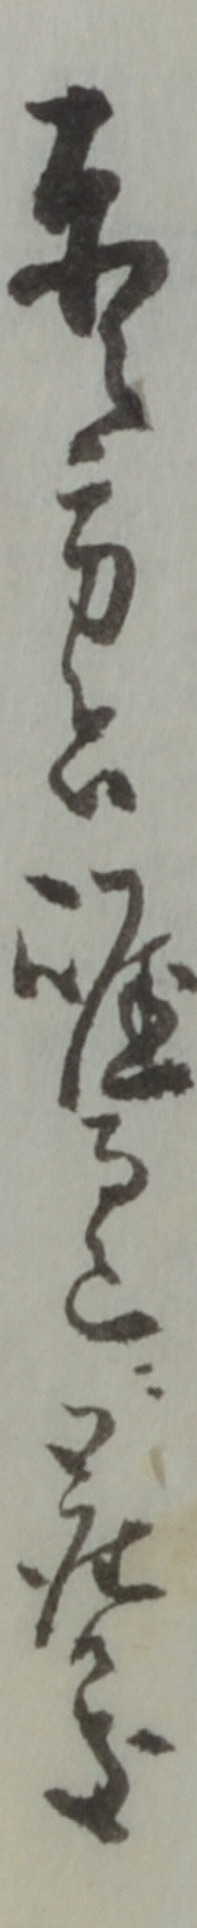東之方は崕而迄ニ御座候処

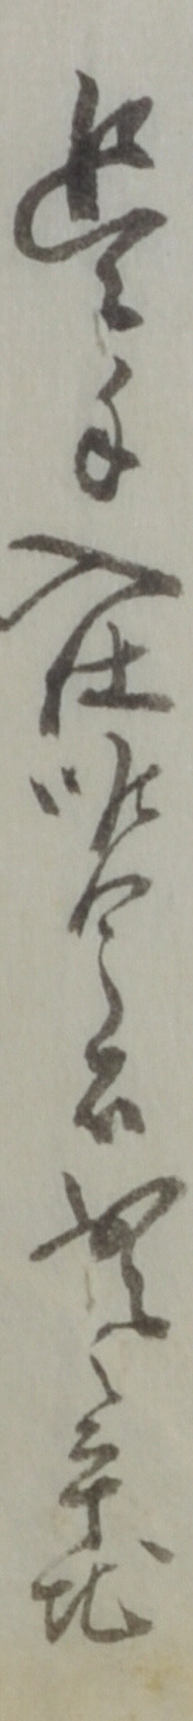追々手入仕昨今は空之平地
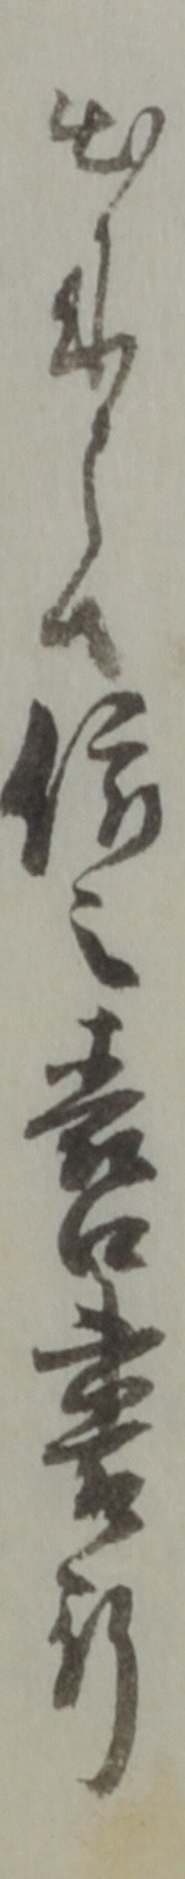出水申候依之表口裏行
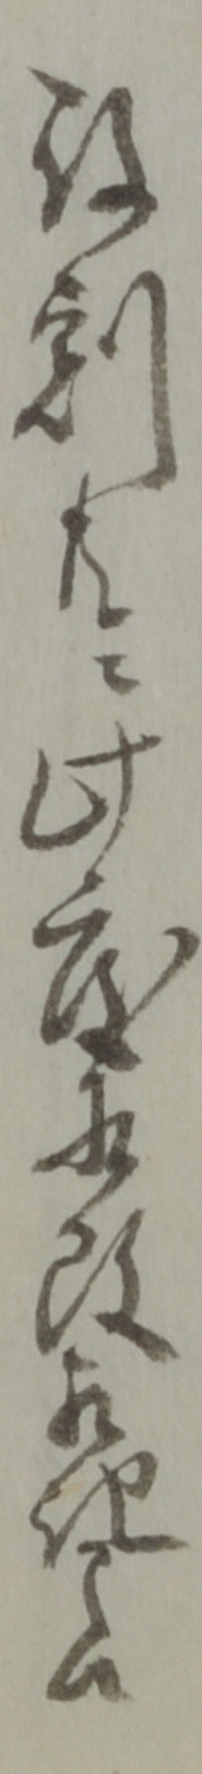役割共ニ此度相改相記申候
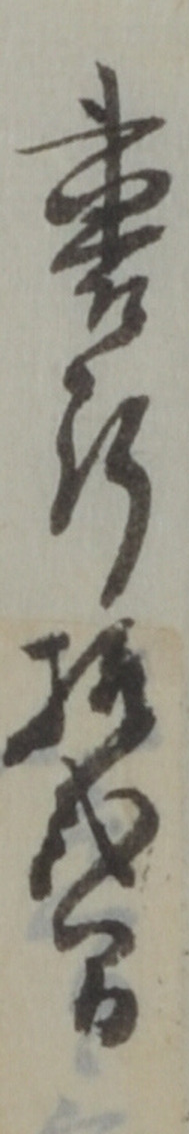裏行拾弐間
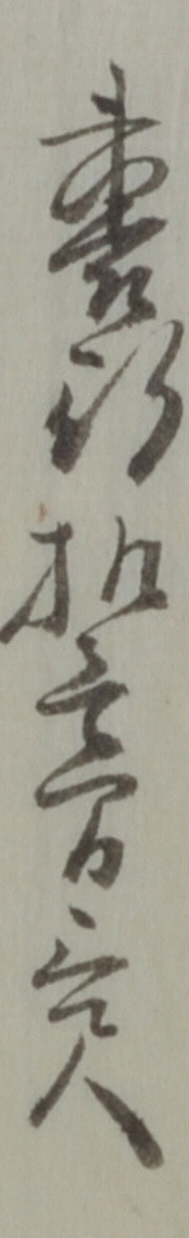裏行拾壱間三尺
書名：屋敷表口裏行書上
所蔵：伊那市立高遠町図書館・合同会社AMANE
